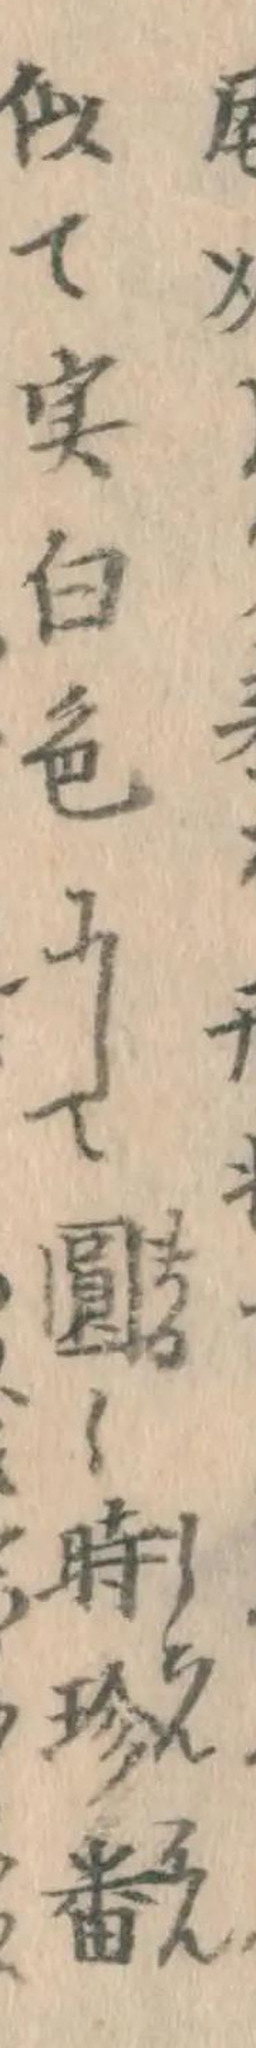似て実白色にして円し時珍畨
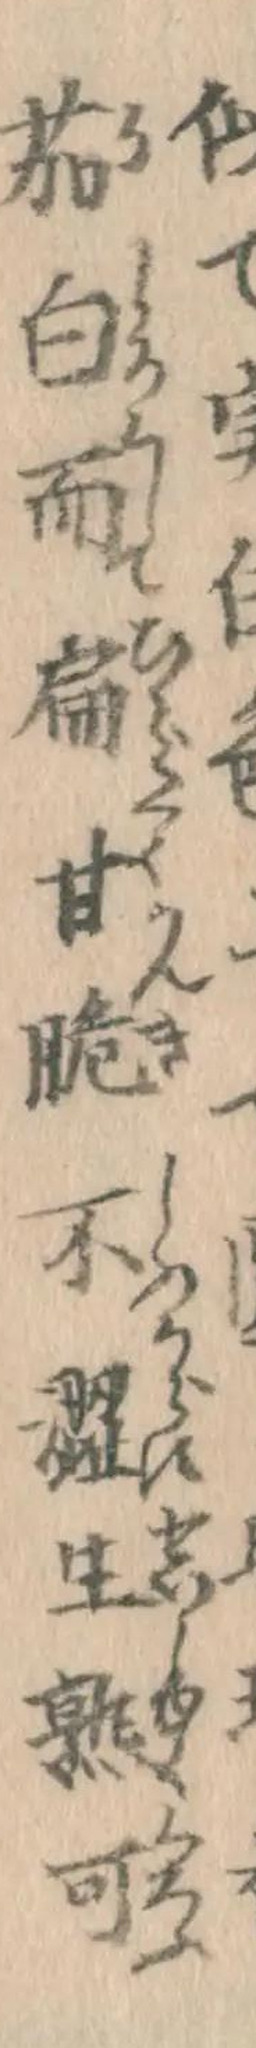茄白而扁甘脆不渋生熟可

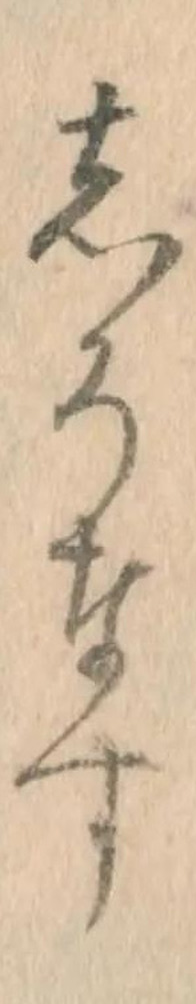しろなす
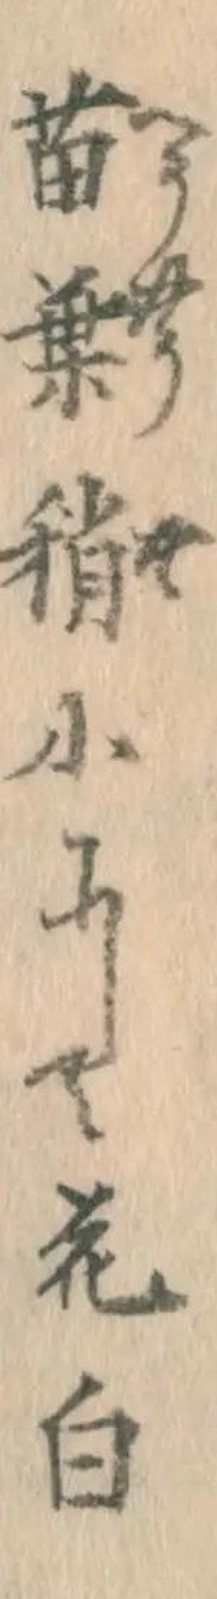苗葉稍小にして花白
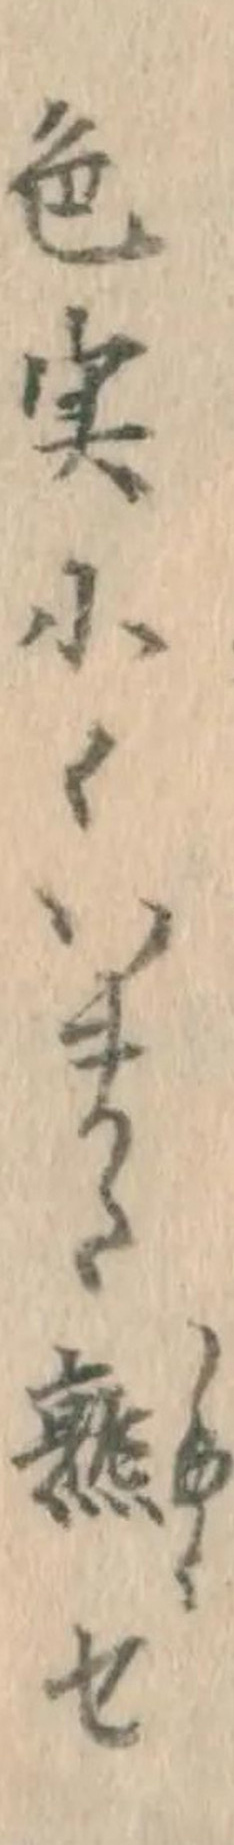色実小くいまた熟せ
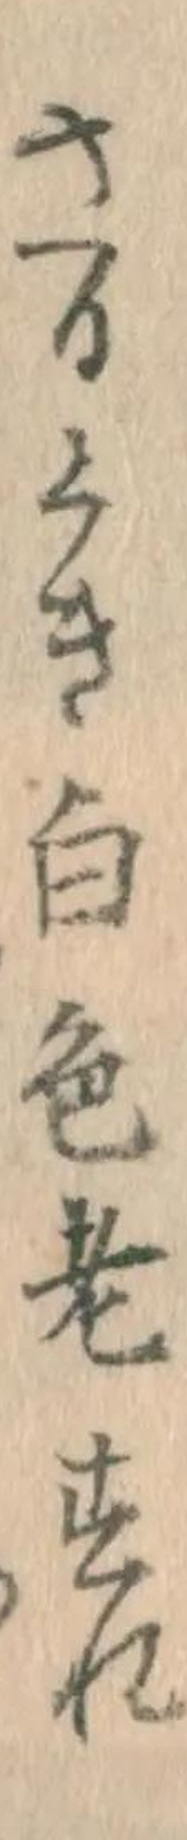さるとき白色老すれ
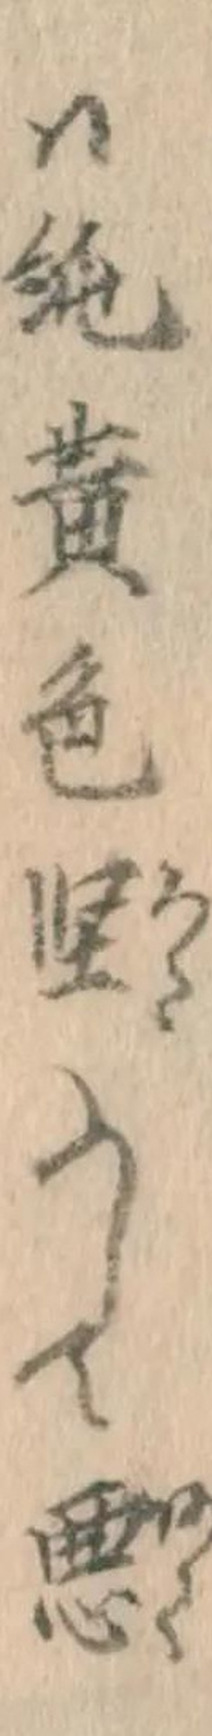は純黄色堅ふして
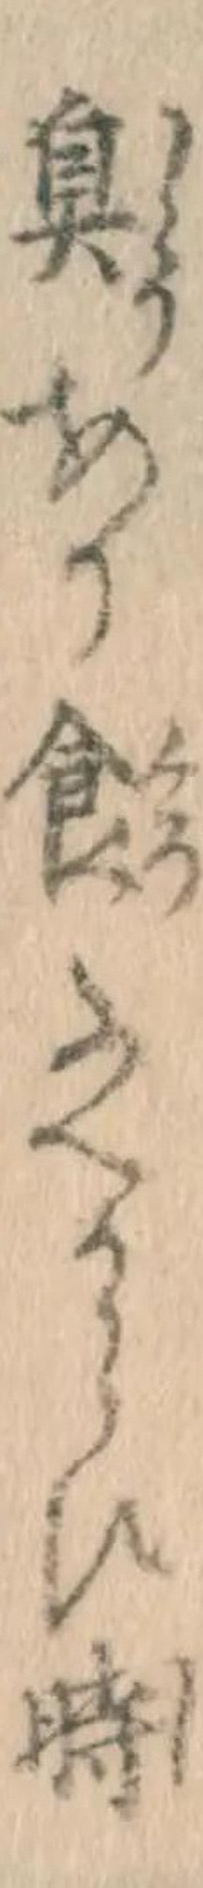臭あり食ふへからす時
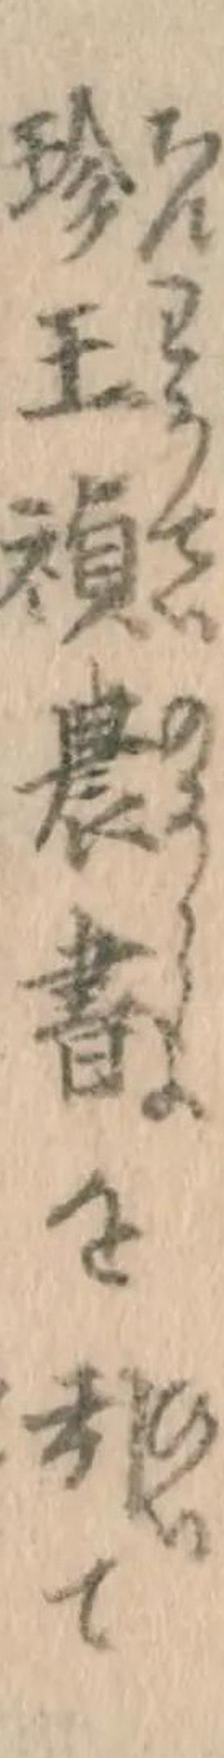珍王禎農書を引て
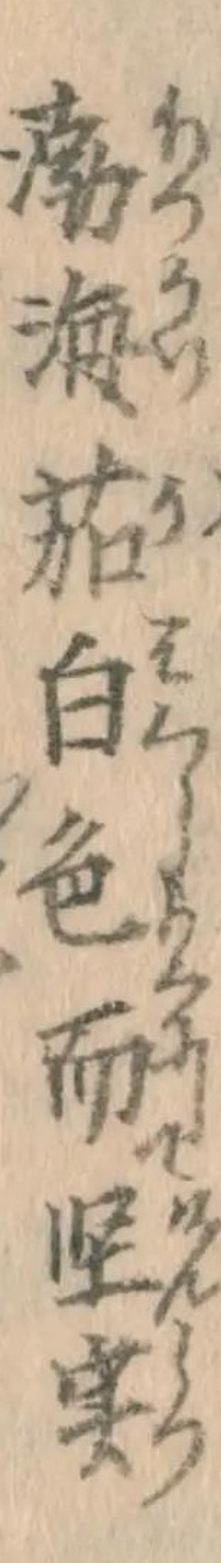渤海茄白色而堅実
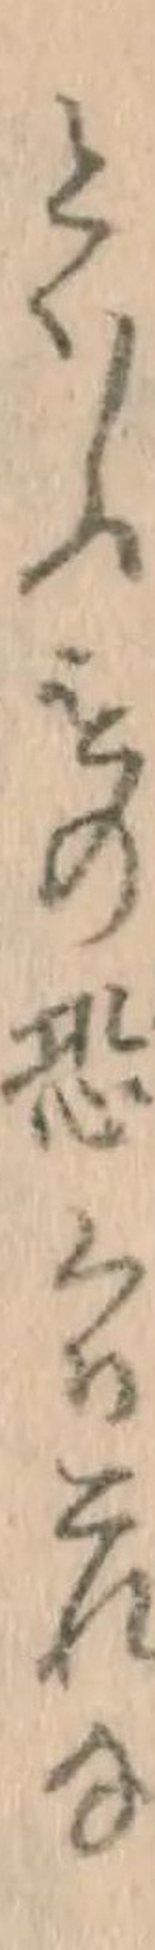といふもの恐くはこれな
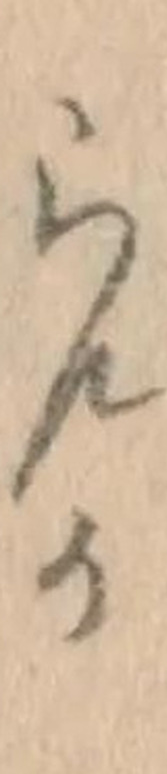らんか
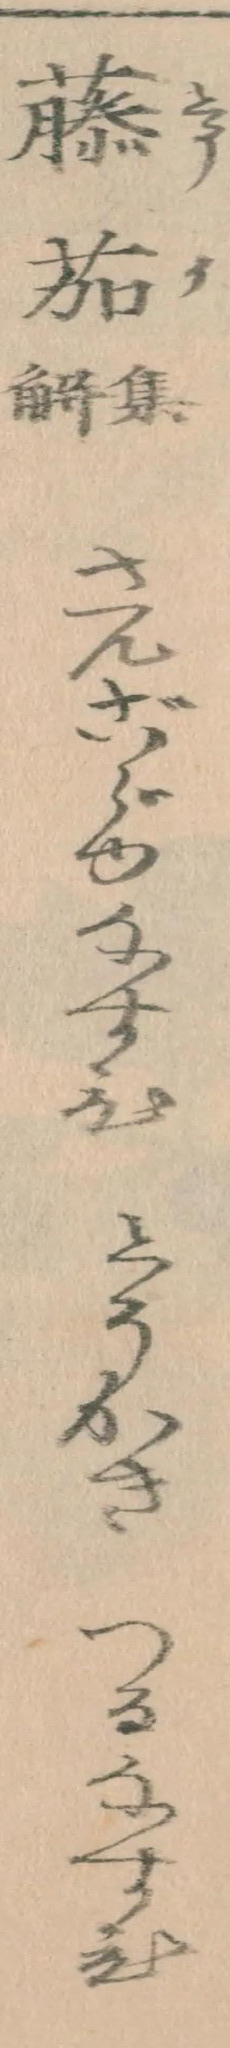藤茄集解さんごじゆなすひとうかきつるなすひ
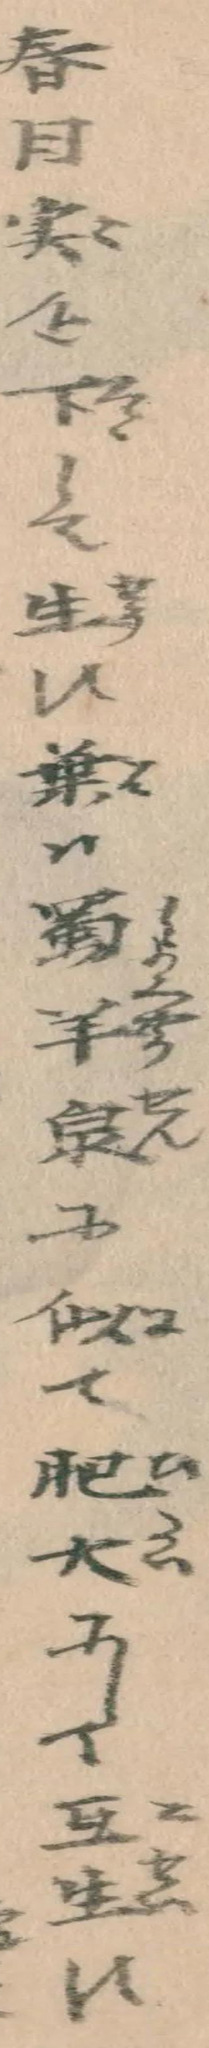春月実を下して生す葉は蜀羊泉に似て肥大にして互生す
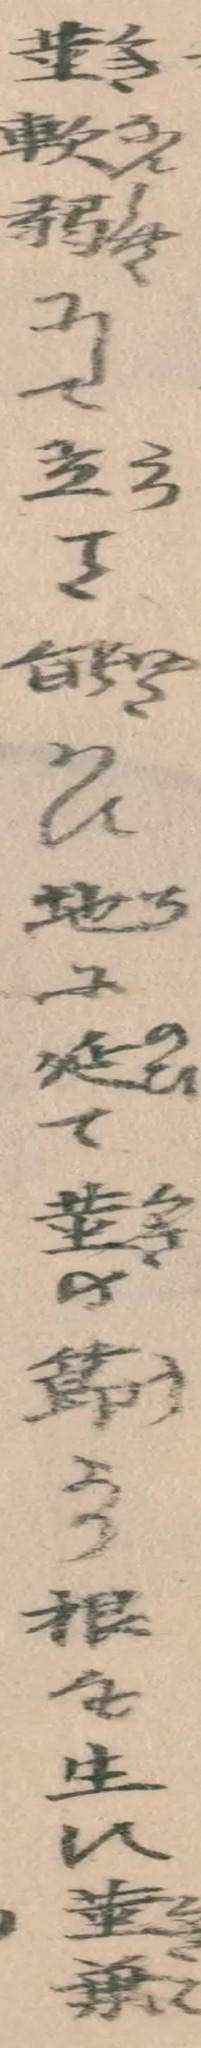茎軟弱にして立こと能す地に延て茎の節より根を生す茎葉
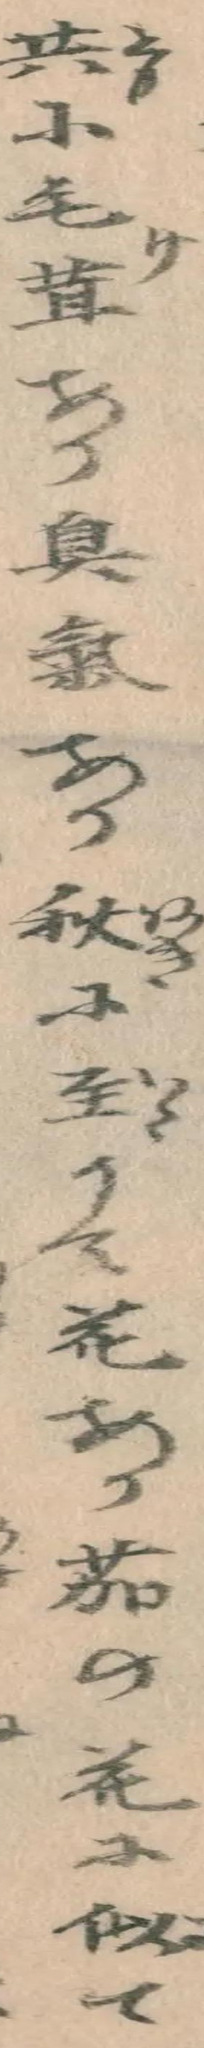共に毛茸あり臭気あり秋に至りて花あり茄の花に似て
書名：本草図譜. 巻52-54
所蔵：国立国会図書館 National Diet Library, JAPAN
